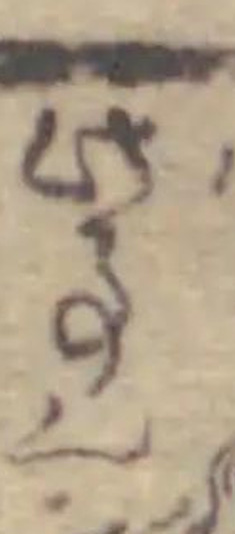此事也
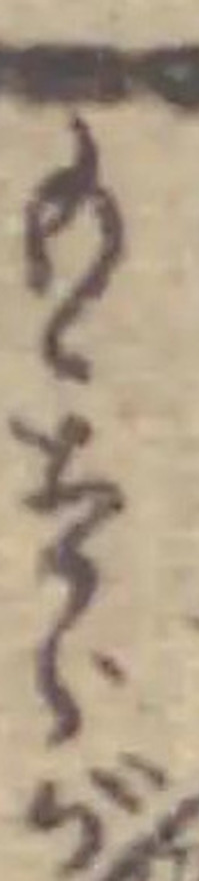もゝ太郎が
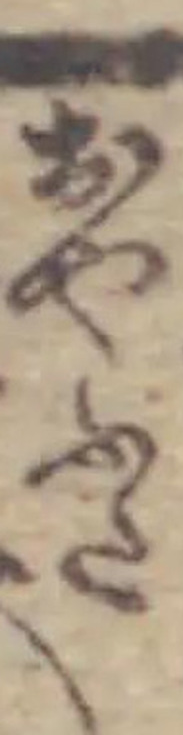おやふた
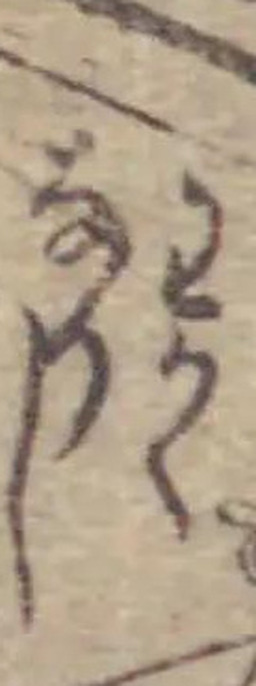なりし
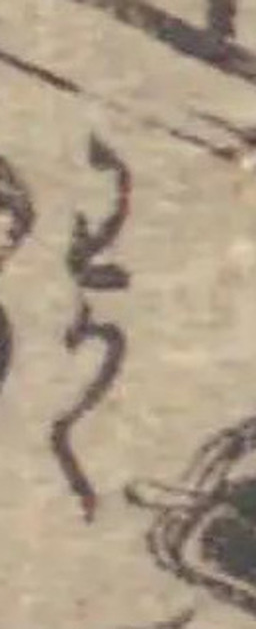わかく
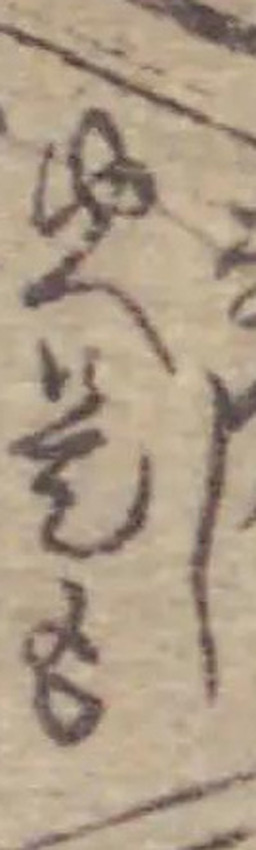ゆへ是も
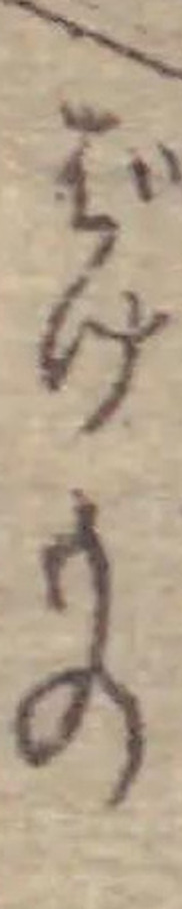ばけもの

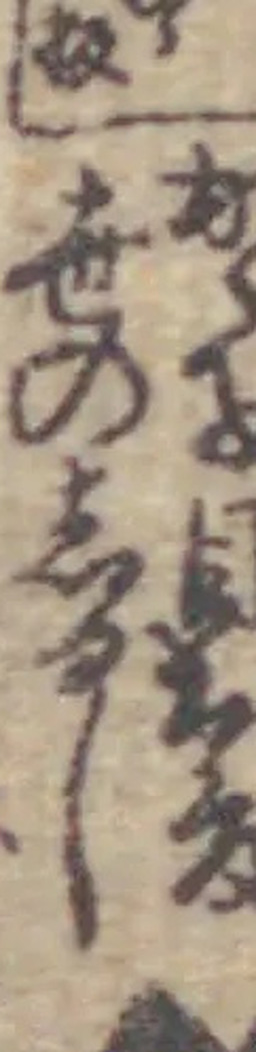世のしるし
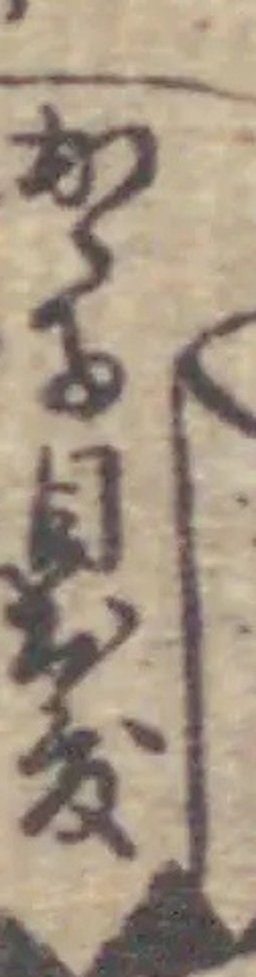かゝる目出度
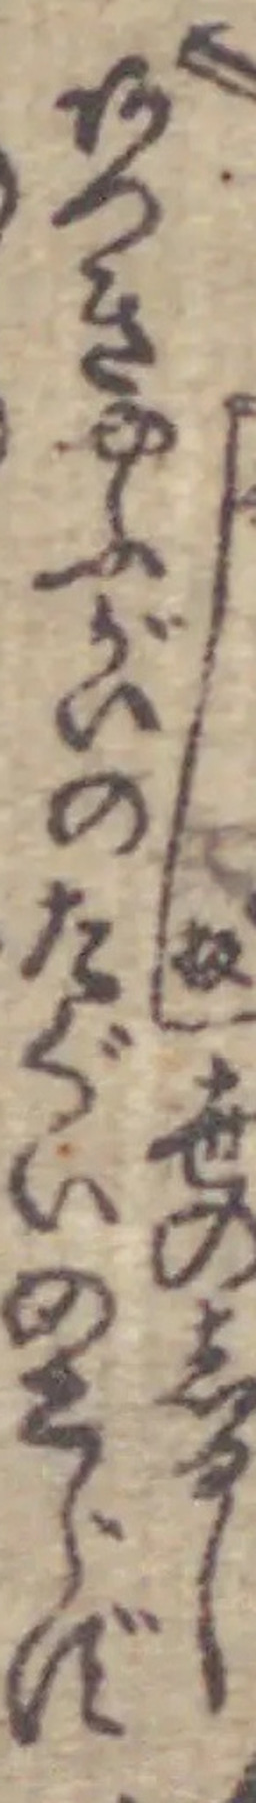あつきやふがいのたぐいのこらず
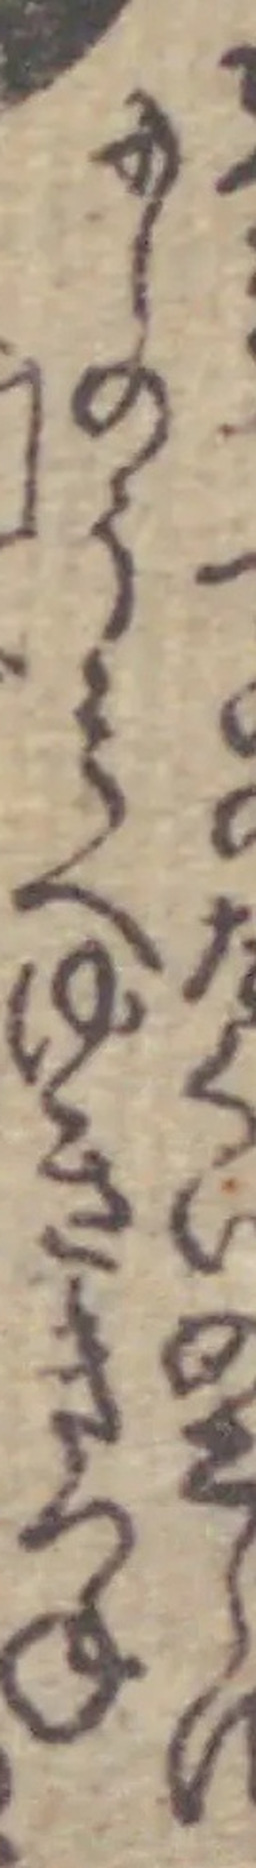にしのうみへゆききつね
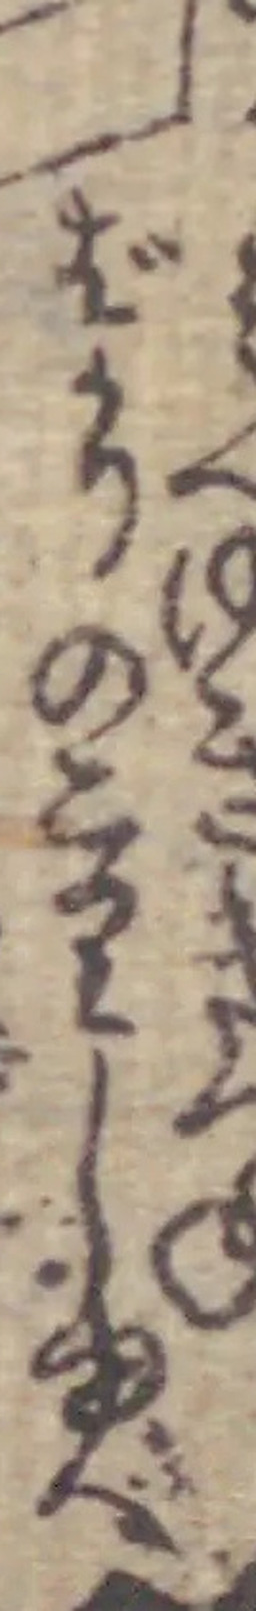ばかりのこりしゆへ
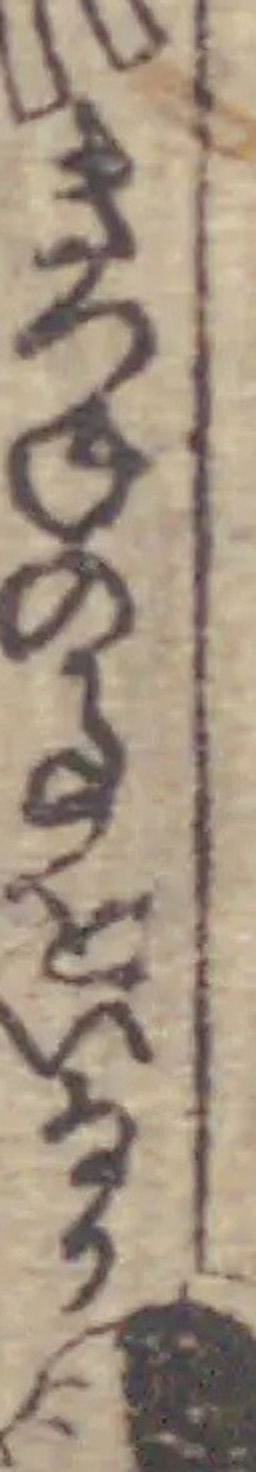きつねの事をいなり
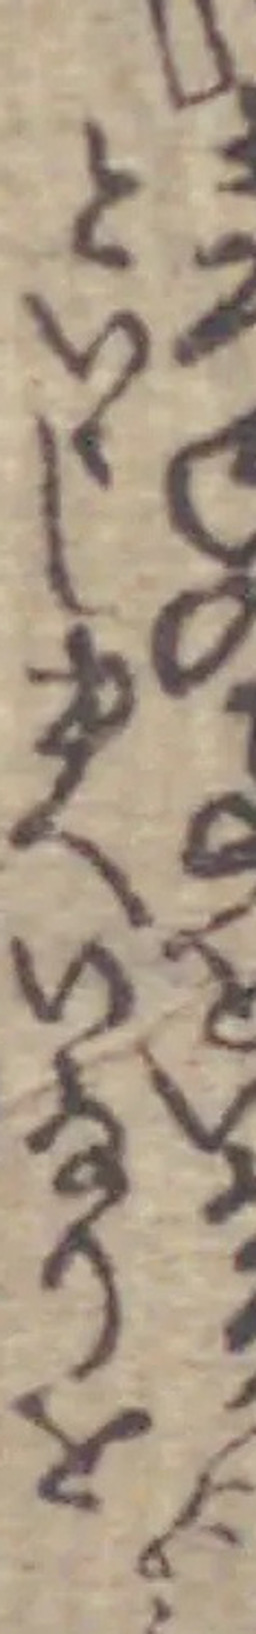といゝしゆへいなりを
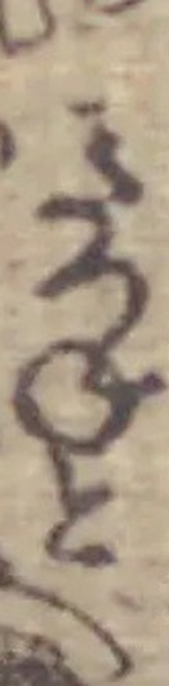きつねと
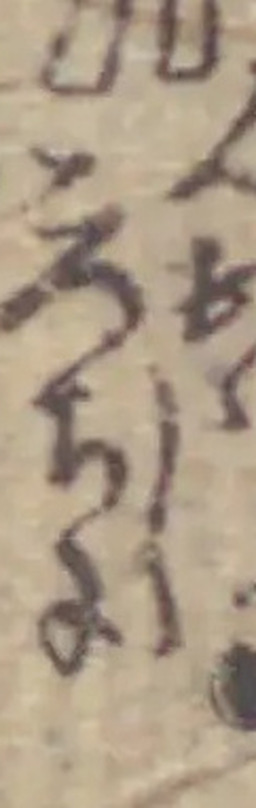こつちに
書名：化物箱根先 2巻
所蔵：国立国会図書館 National Diet Library, JAPAN
